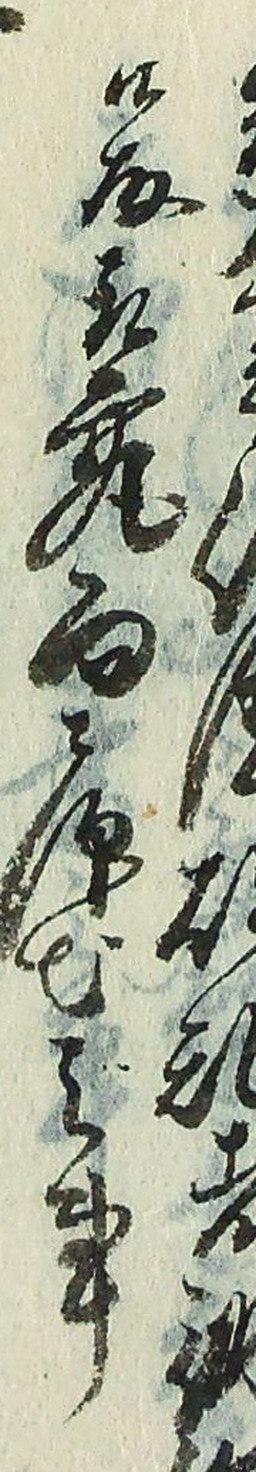候故取究向被仰出之事
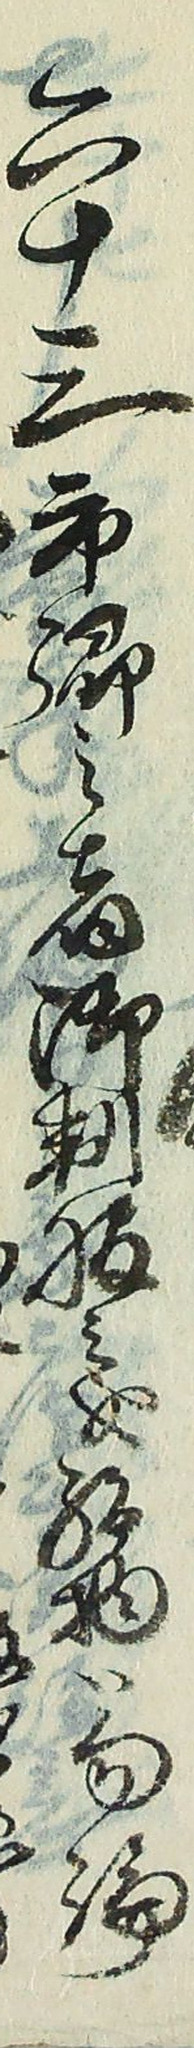六十三市郷之者御制服之義絹物ハ勿論
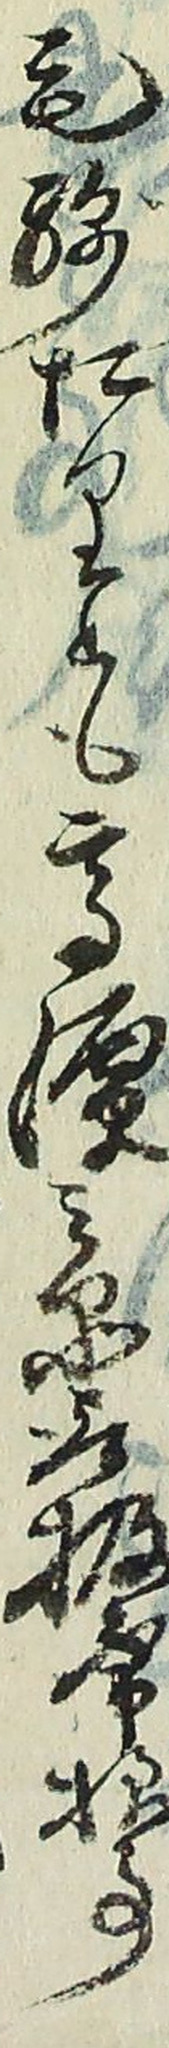毛綿たりとも高價之品取扱不申様事
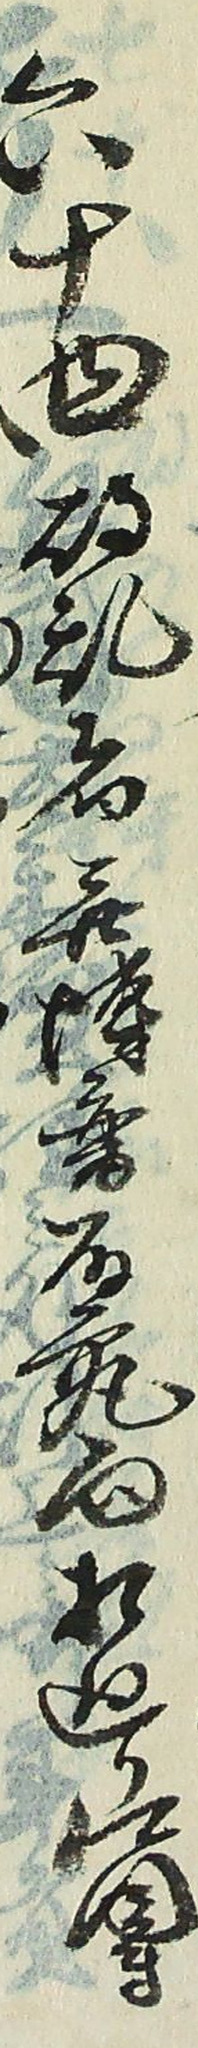六十四胡乱者幷博奕取究向打廻り郷目付
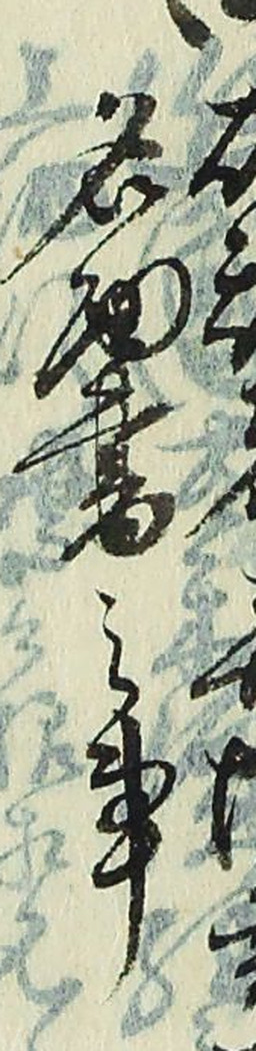名面書之事
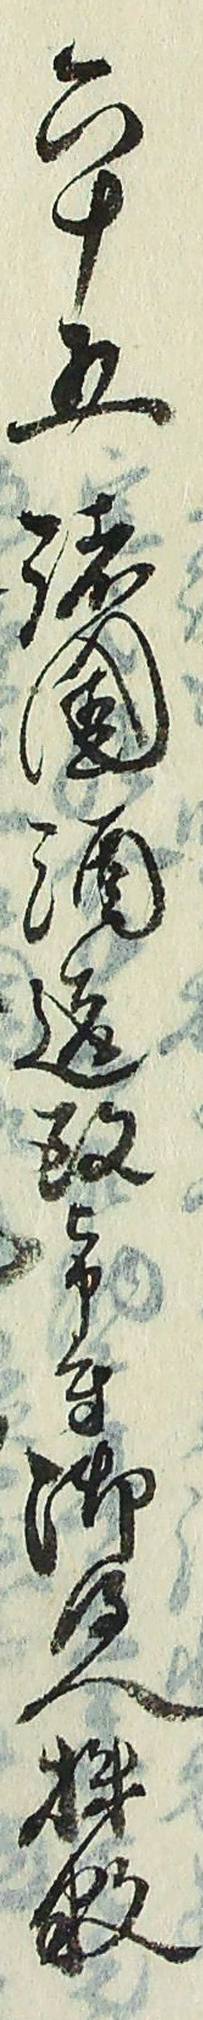六十五諸国酒造改被申付御役人株数
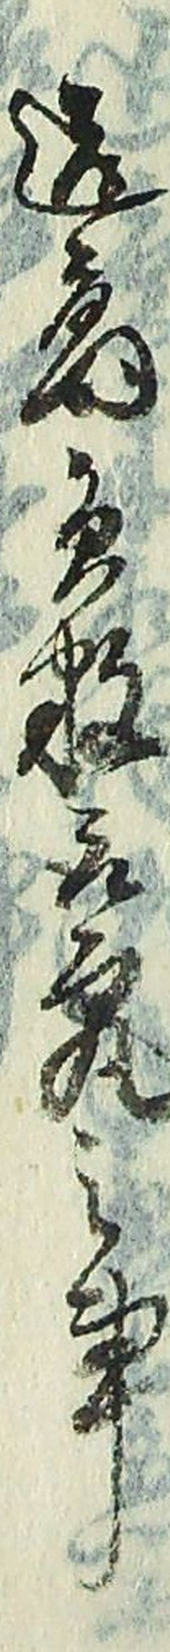造高員数取究之事
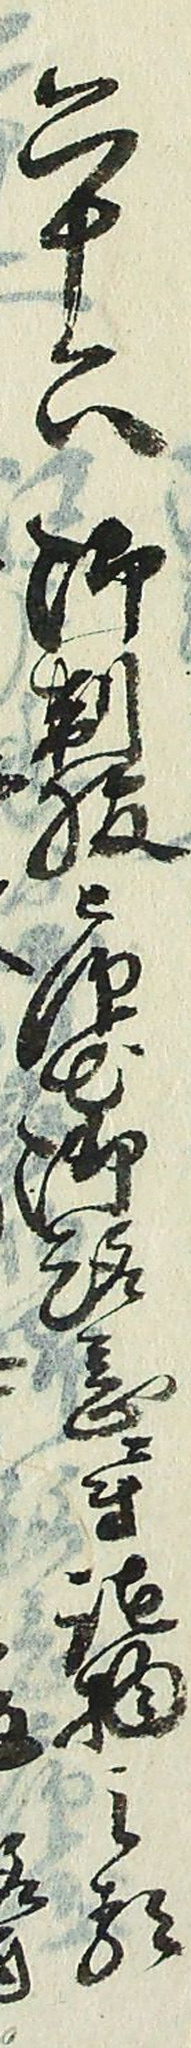六十六御制服被仰出御趣意ニ付諸物之類
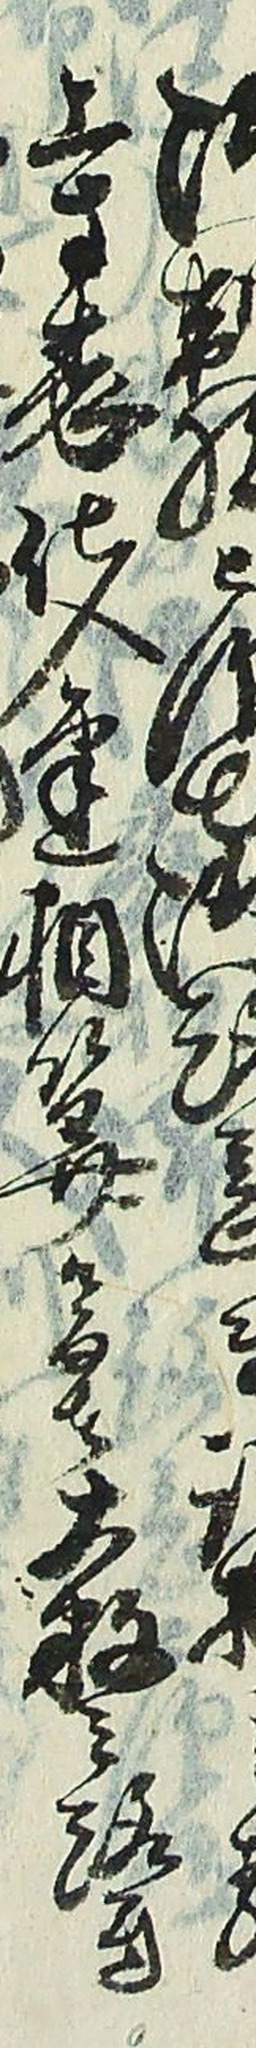上方表仕入金相算候而者大数之趣付
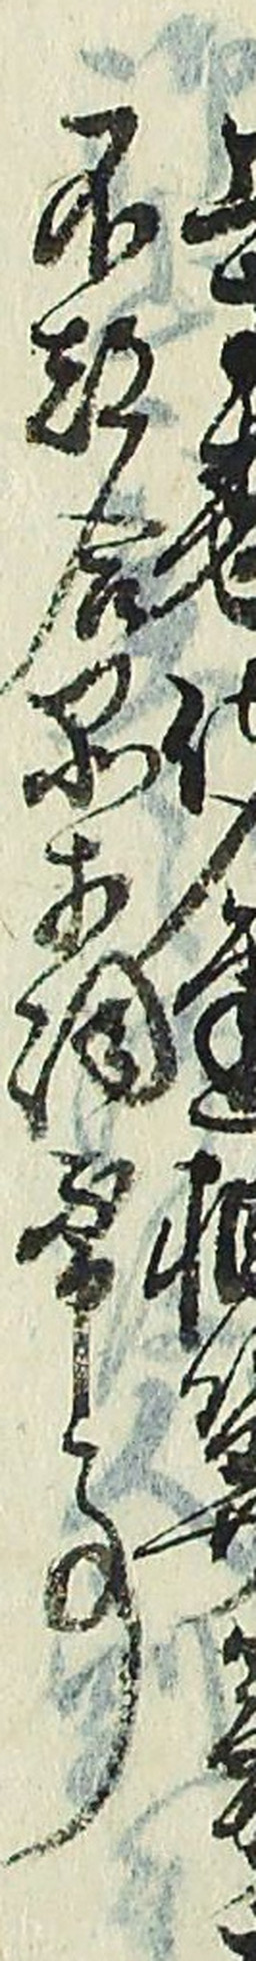不都合品相調不申事
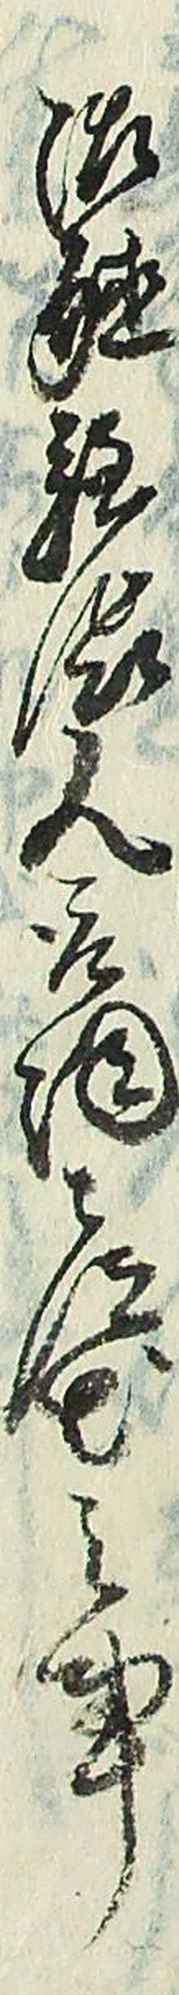御聴難渋人取調被仰出之事

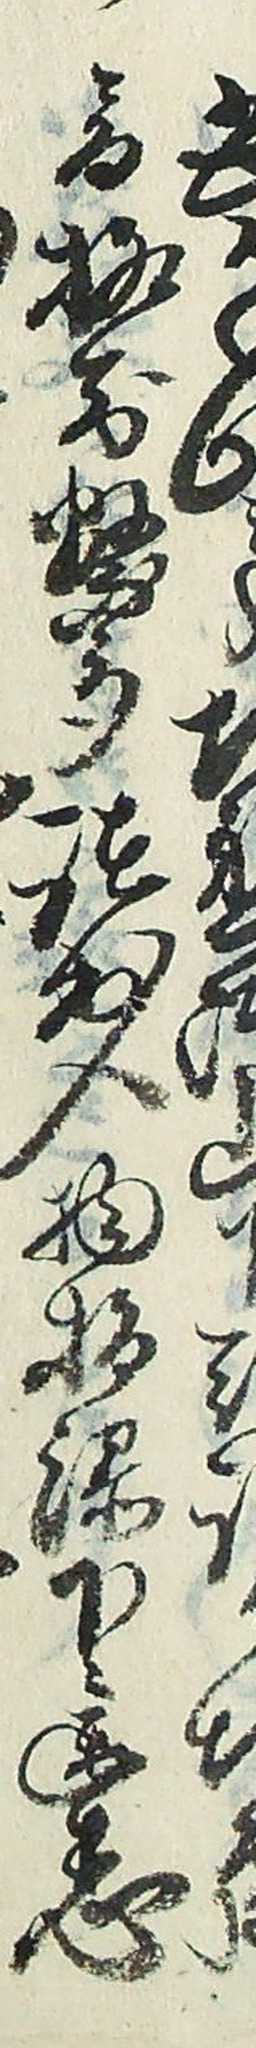ニ而格別繁多諸出入物指添下々迷惑
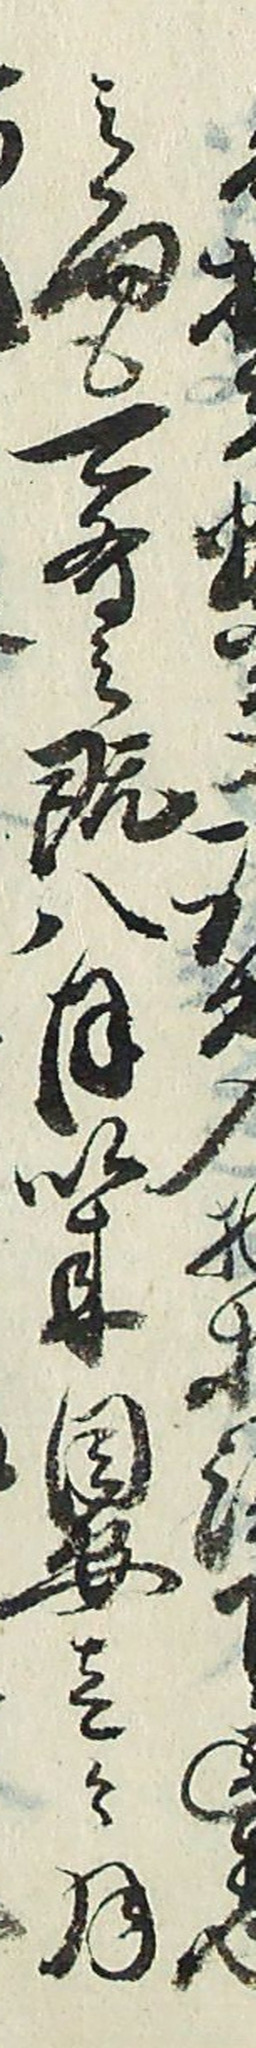之向も可有之既八月以来目安壱ヶ月
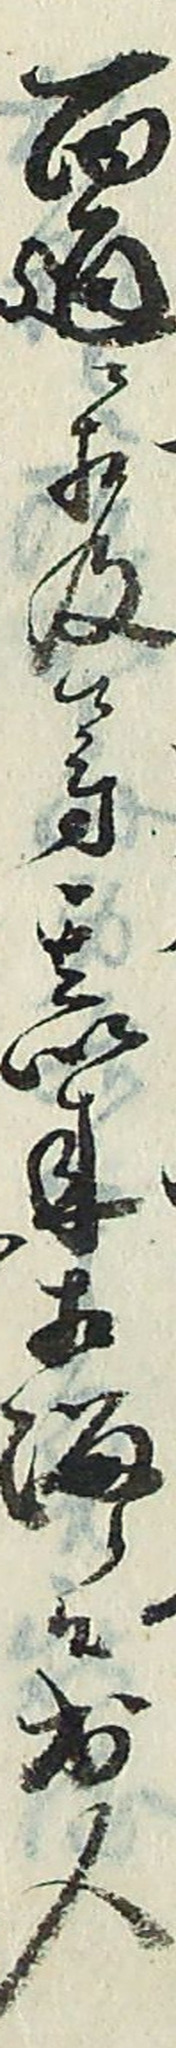百通ニ相及候ニ付其以来相溜り候出入
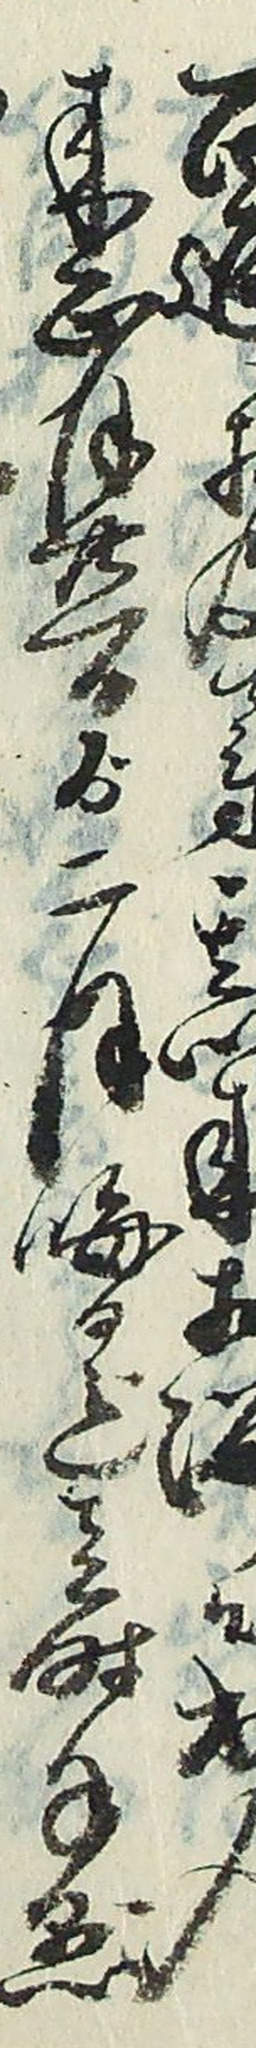来正月廿一日ゟ二月晦日迄壱時手懸
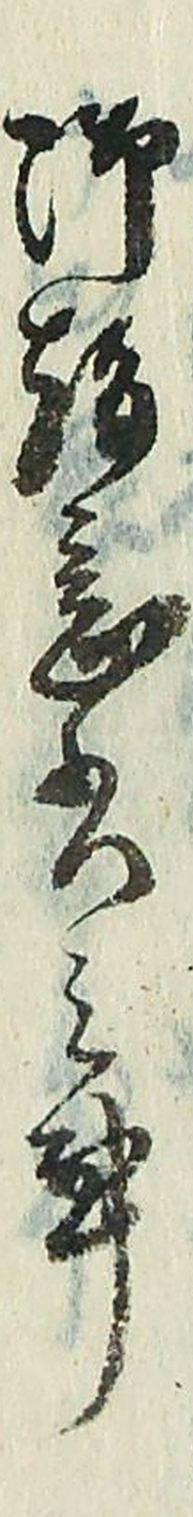御趣意書之事
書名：諸御趣意書并御下知向之写
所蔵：鳴門教育大学 Naruto University of Education
